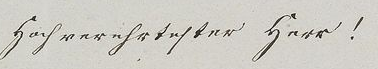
Hochverehrtester Herr!
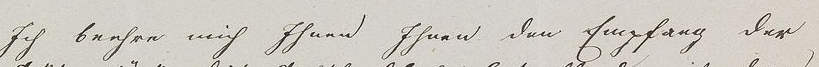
Ich beehre mich Ihnen Ihnen den Empfang der
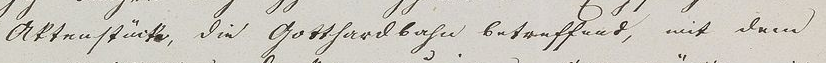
Aktenstücke, die Gotthardbahn betreffend, mit dem
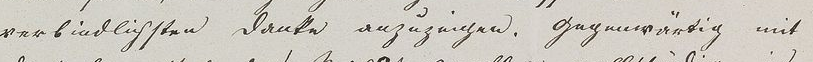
verbindlichsten Danke anzuzeigen. Gegenwärtig mit
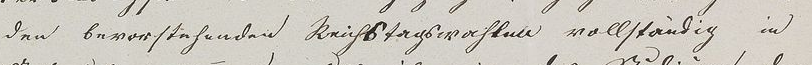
den bevorstehenden Reichstagswahlen vollständig in
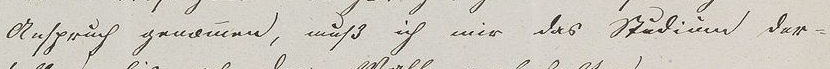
Anspruch genommen, muß ich mir das Studium der-
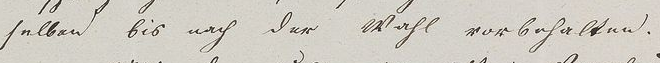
selben bis nach der Wahl vorbehalten.
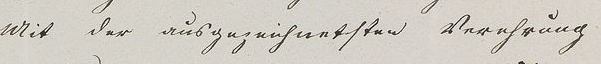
Mit der ausgezeichnetsten Verehrung
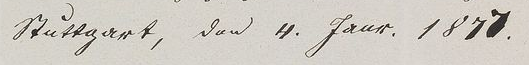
Stuttgart, den 4. Janr. 1877.
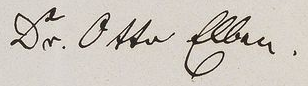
Dr. Otto Elben.
